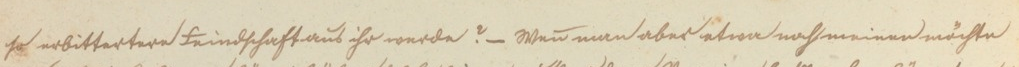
so erbittertere Feindschaft aus ihr werde? – Wenn man aber etwa noch meinen möchte,
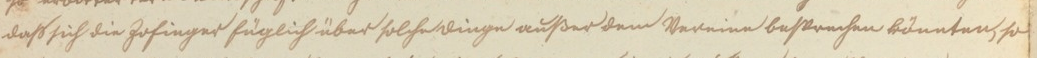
dass sich die Zofinger füglich über solche Dinge außer dem Vereine besprechen könnten, so
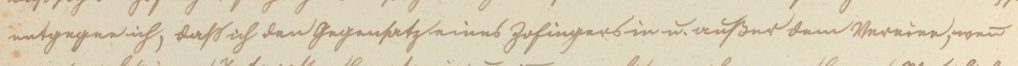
entgegne ich, dass ich den Gegensatz eines Zofingers in u. außer dem Vereine, wenn
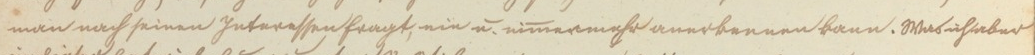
man nach seinen Interessen fragt, nie u. nimmermehr anerkennen kann. Was ich aber
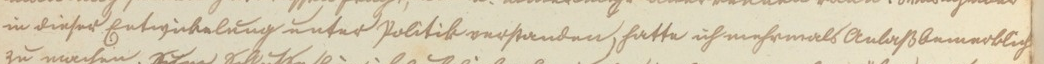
in dieser Entwickelung unter Politik verstanden, hatte ich mehrmals Anlaß bemerklich
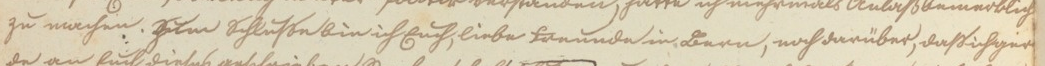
zu machen. Zum Schlusse bin ich Euch, liebe Freunde in Bern, noch darüber, dass ich gera-
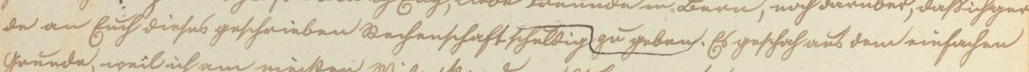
de an Euch dieses geschrieben Rechenschaft zu geben schuldig . Es geschah aus dem einfachen
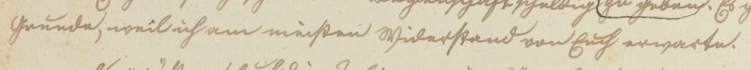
Grunde, weil ich am meisten Widerstand von Euch erwarte.
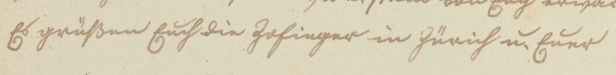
Es grüßen Euch die Zofinger in Zürich u. Euer
